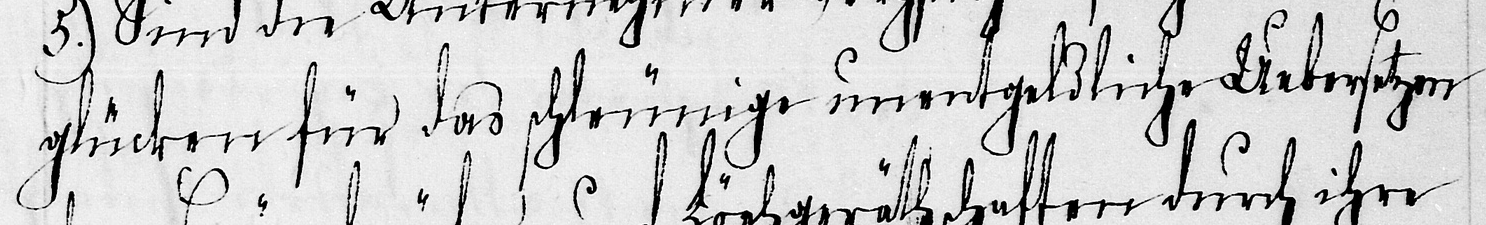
glücken für das schleunige unentgeldliche Uebersetzen
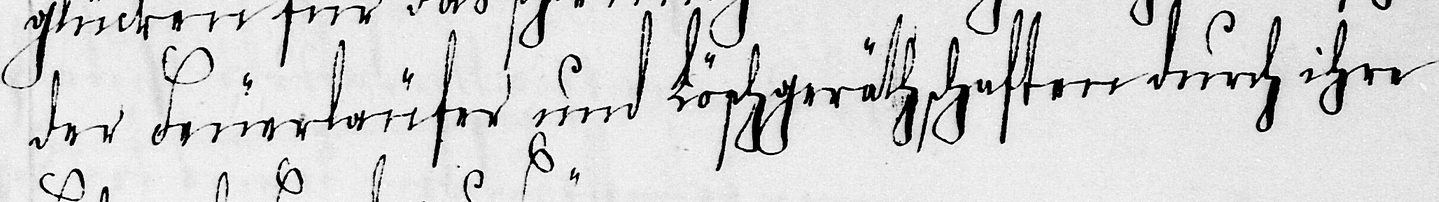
der Feuerläufer und Löschgeräthschaften durch ihre
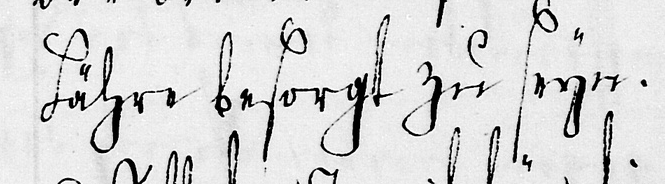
Fähre besorgt zu seyn.
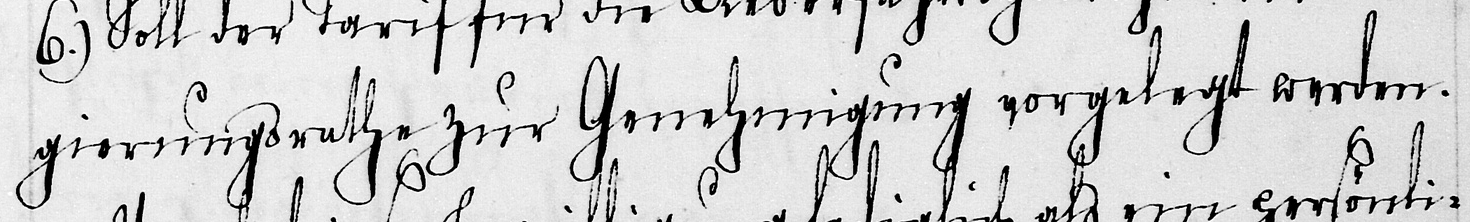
gierungsrathe zur Genehmigung vorgelegt werden.
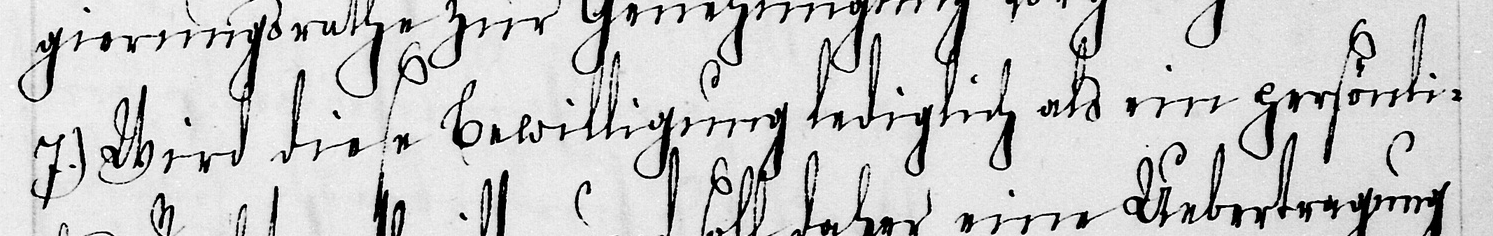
7.) Wird diese Bewilligung lediglich als ein persönli¬
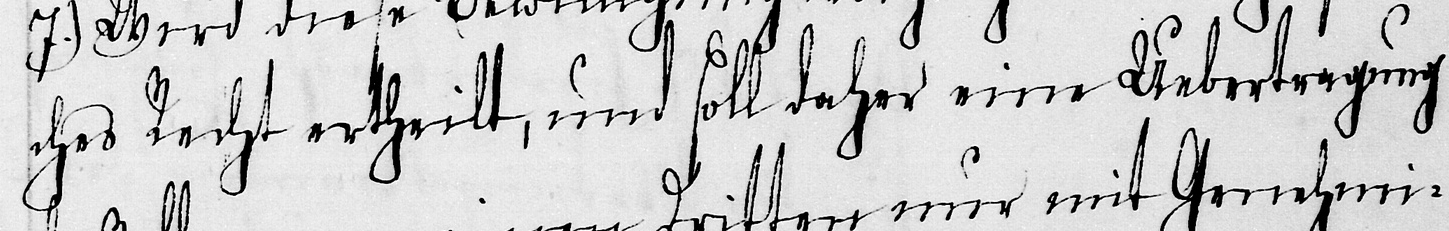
ches Recht ertheilt, und soll daher eine Uebertragung
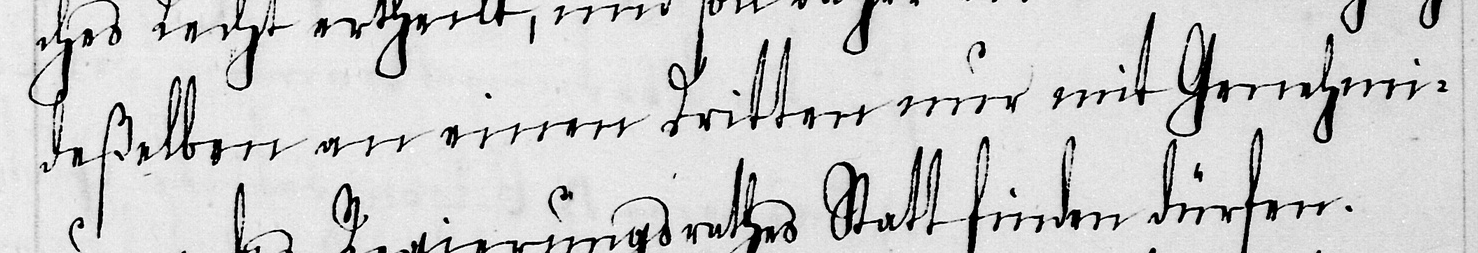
deßelben an einen Dritten nur mit Genehmi¬
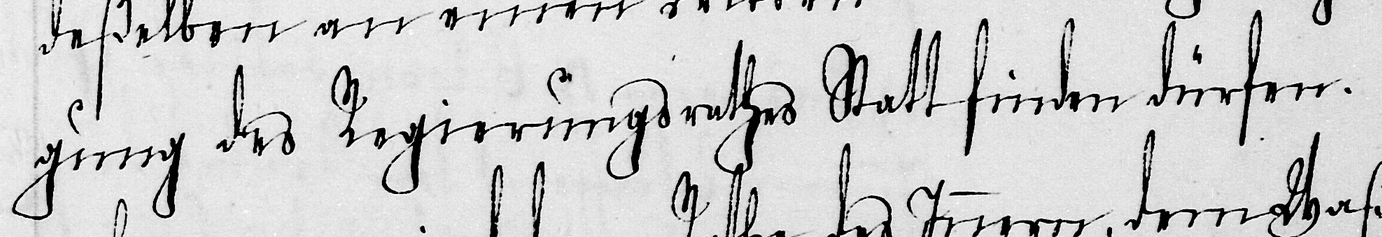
gung des Regierungsrathes Statt finden dürfen.
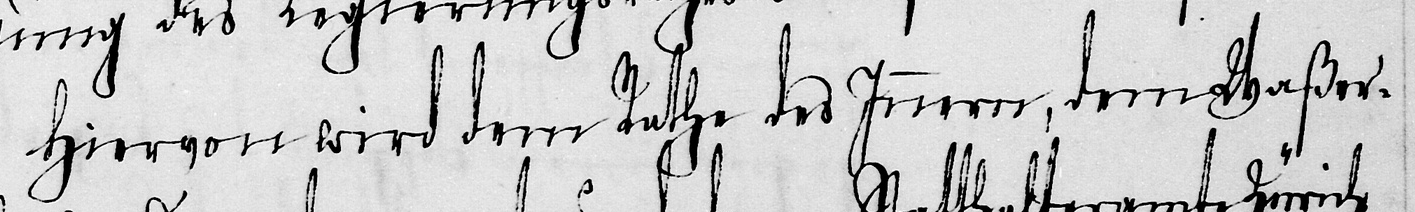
Hiervon wird dem Rathe des Innern, dem Waßer¬
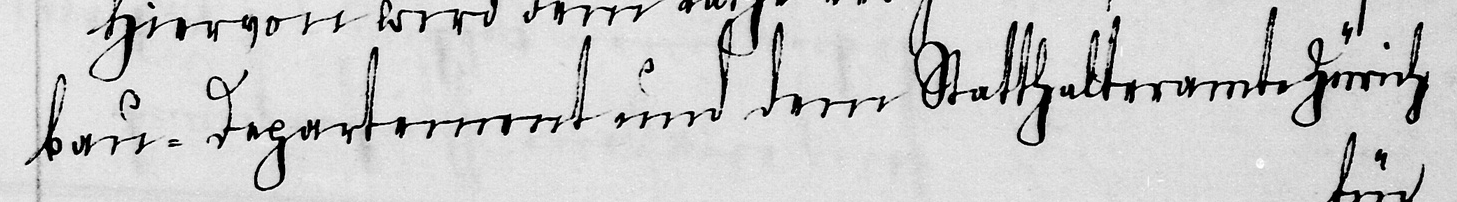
bau-Departement und dem Statthalteramte Zürich
